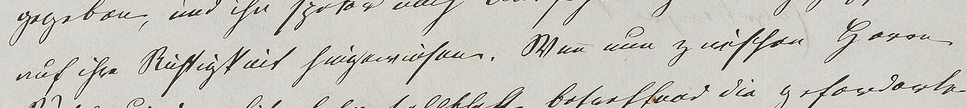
auf ihre Richtigkeit hingewiesen. Wenn nun zwischen Herrn
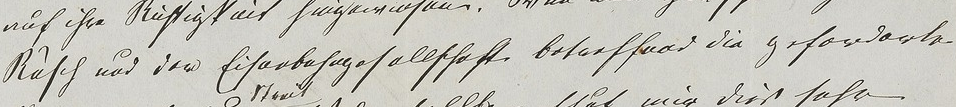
Rüsch und der Eisenbahngesellschaft betreffend die geforderte
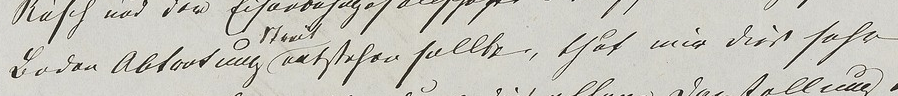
Boden Abtretung Streit entstehen sollte, thut mir dies sehr
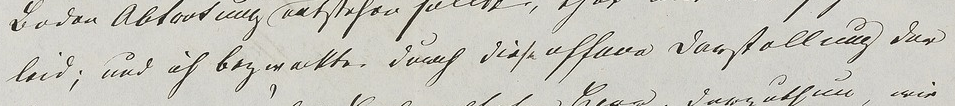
leid; und ich bezweckte durch diese offene Darstellung der
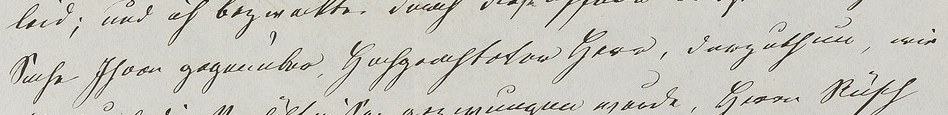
Sache Ihnen gegenüber, Hochgeachteter Herr, darzuthun, wie
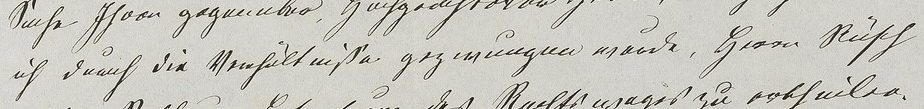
ich durch die Verhältnisse gezwungen wurde, Herrn Rüsch
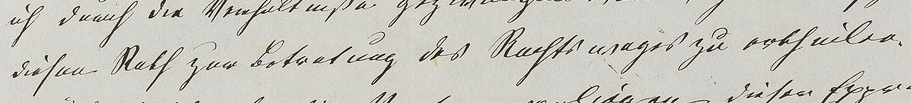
diesen Rath zur Betretung des Rechtsweges zu ertheilen.
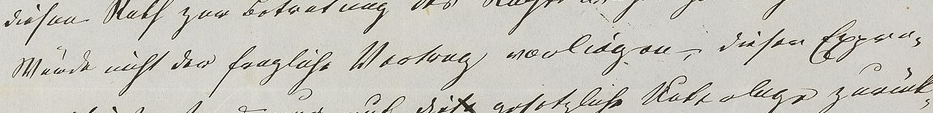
Würde nicht der fragliche Vertrag vorliegen, dieser Expro-
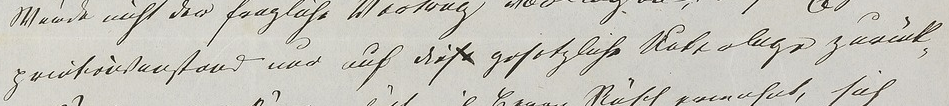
priationsanstand nur auf dise gesetzliche Unterlage zurück-
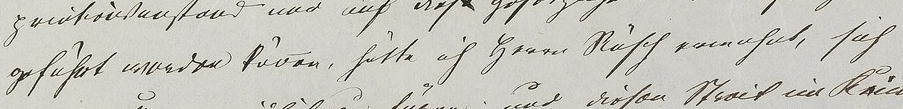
geführt werden können, hätte ich Herrn Rüsch ermahnt, sich
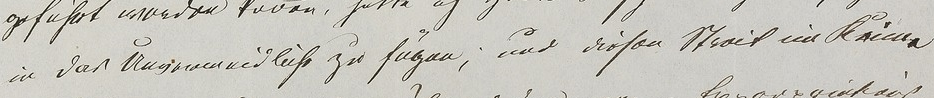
in das Unvermeidliche zu fügen; und diesen Streit im Keime
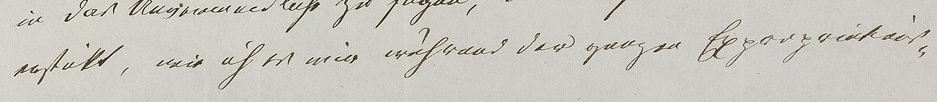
erstickt, wie ich es mir während der ganzen Expropriations-
